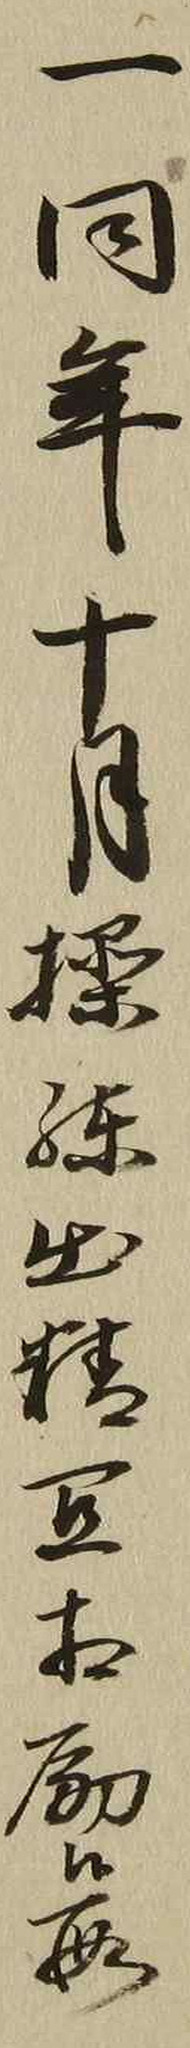一同年十月操練出精宜相励候段
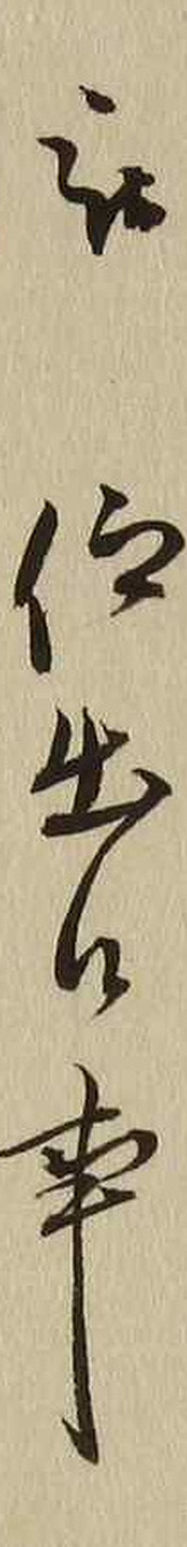被仰出候事
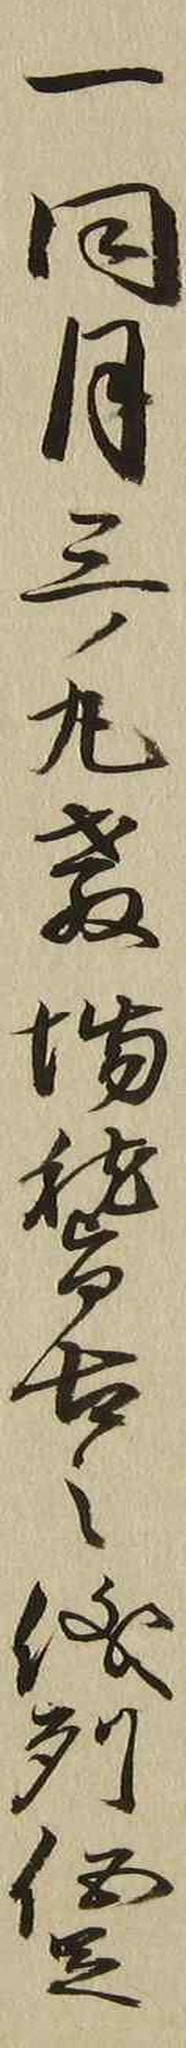一同月三ノ丸教場稽古之儀列伍足
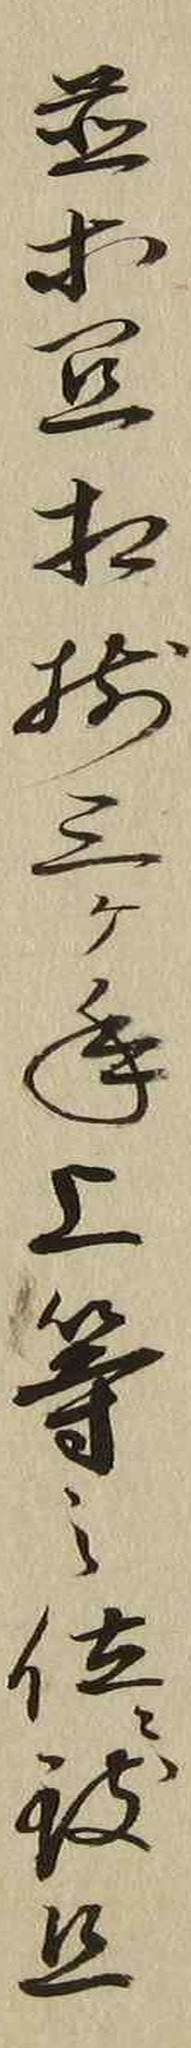並等宜相揃三ヶ年上等之位ニ致且
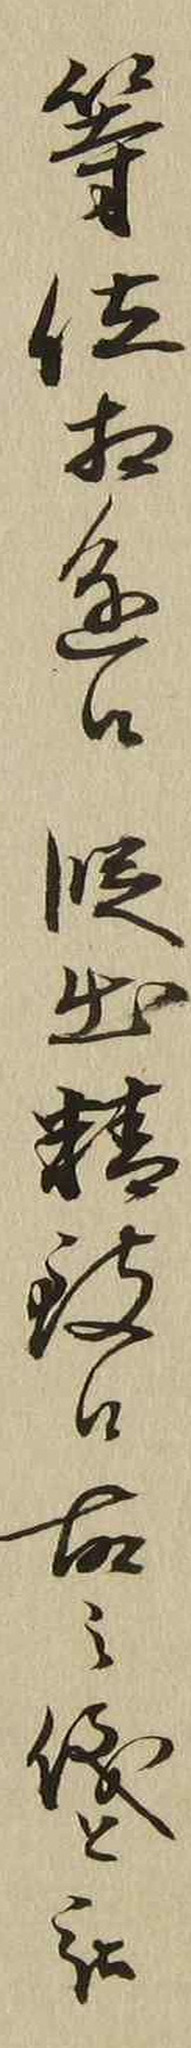等位相進候段出精致候故之儀と被
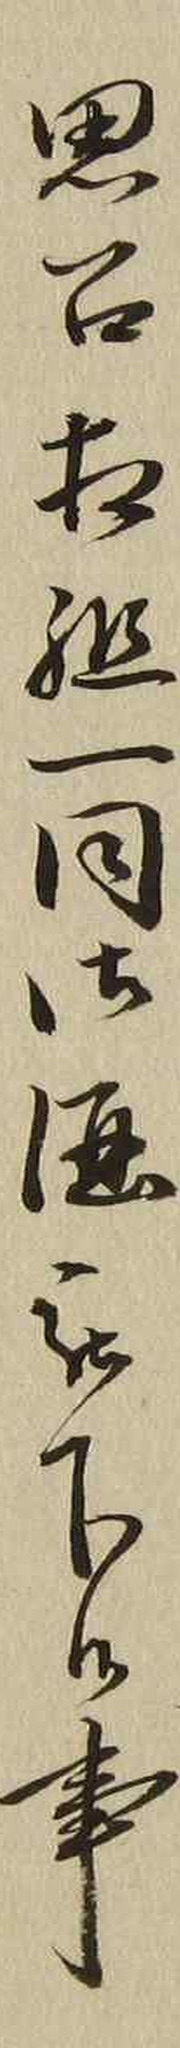思召相組一同御酒被下候事
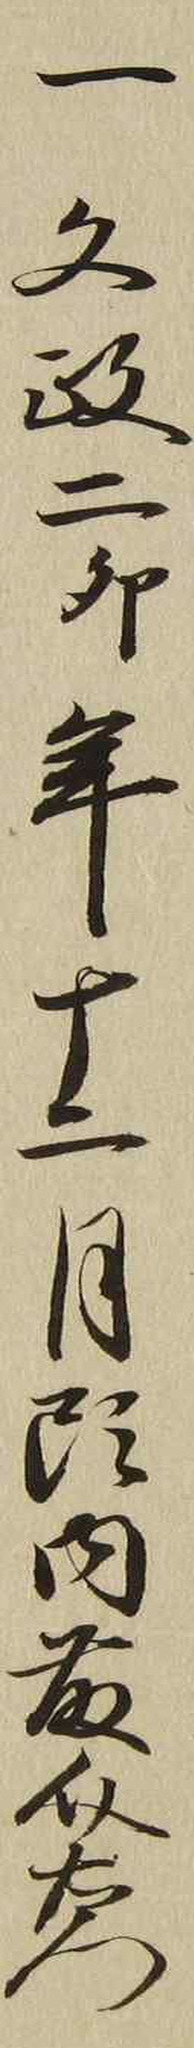一文政二卯年十二月頭内藤介右衛門
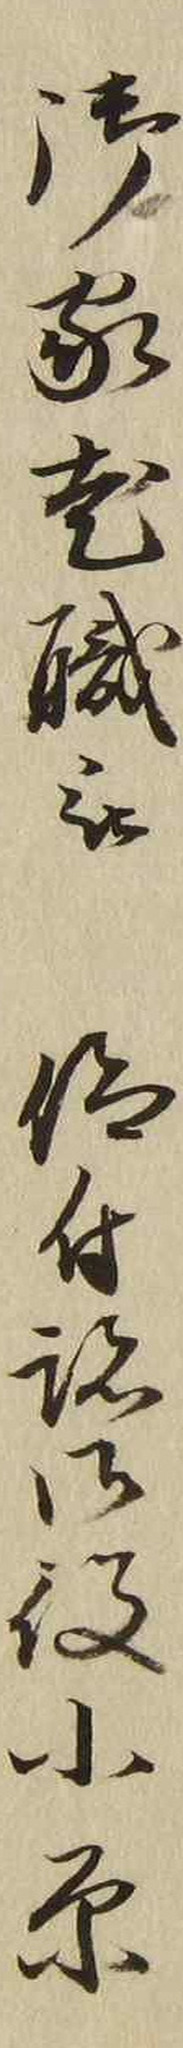御家老職被仰付跡御役小原
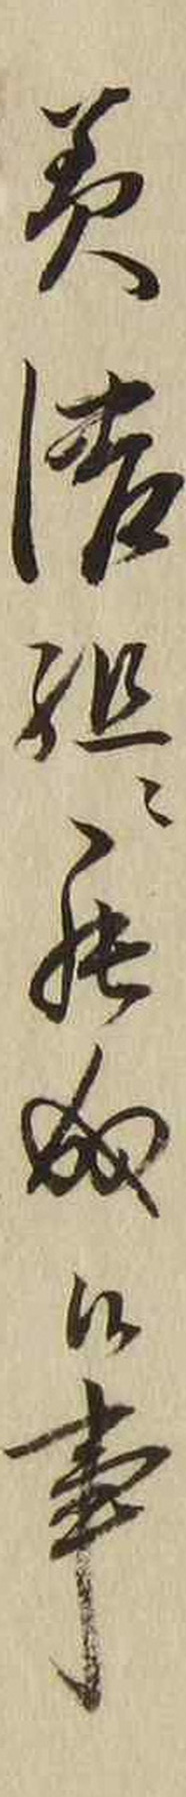美濃組ニ罷成候事

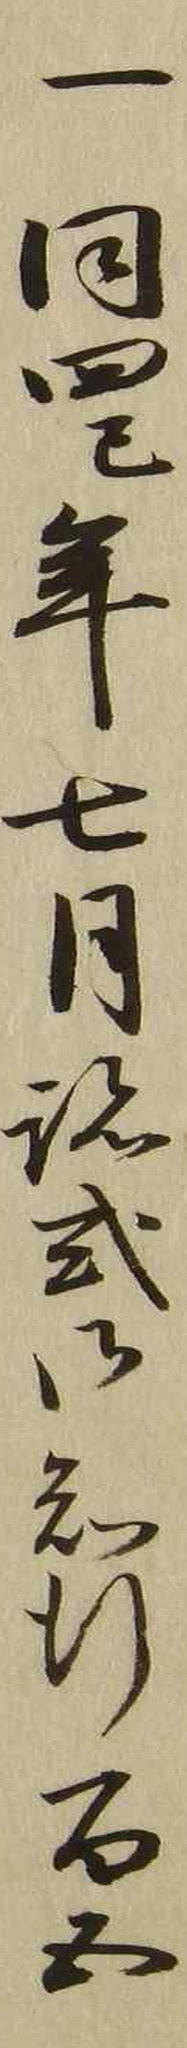一同四巳年七月跡式御知行百五
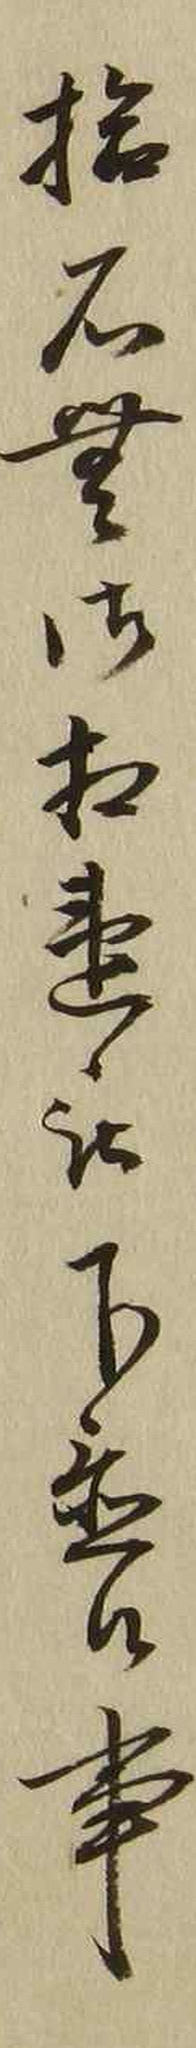拾石無御相違候被下置候事
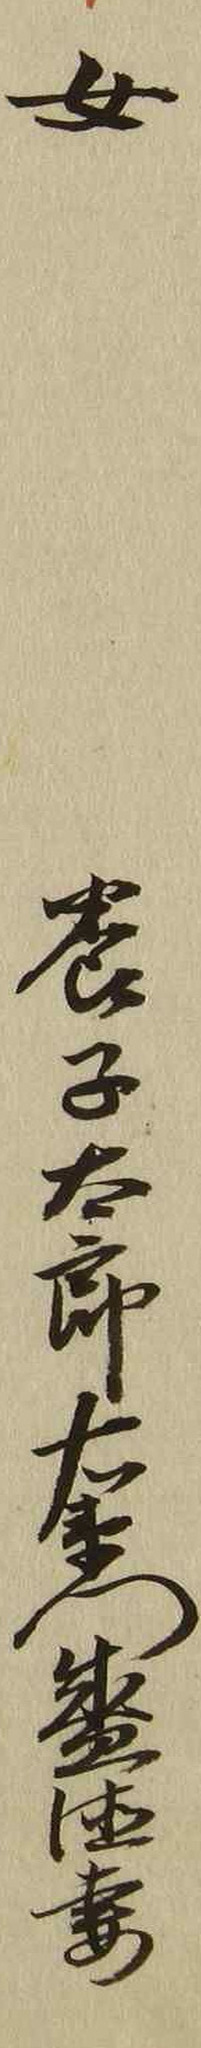女養子太郎右衛門盛徳妻
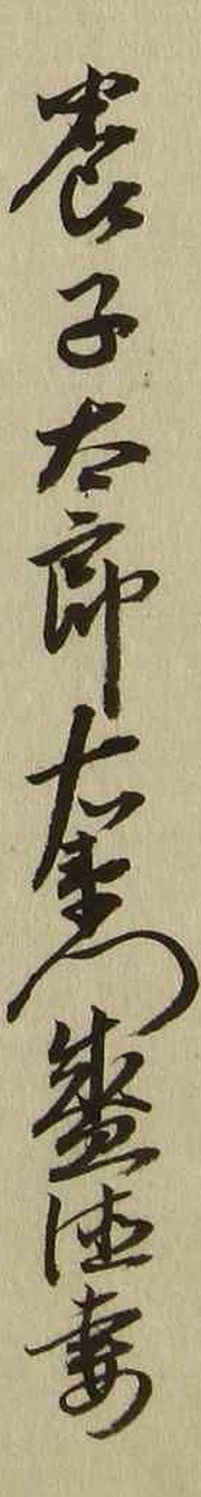女養子太郎右衛門盛徳妻
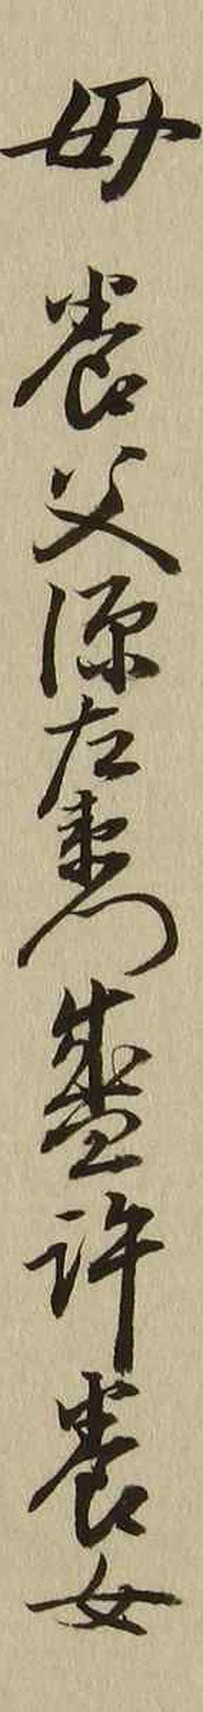母養父源左衛門盛許養女
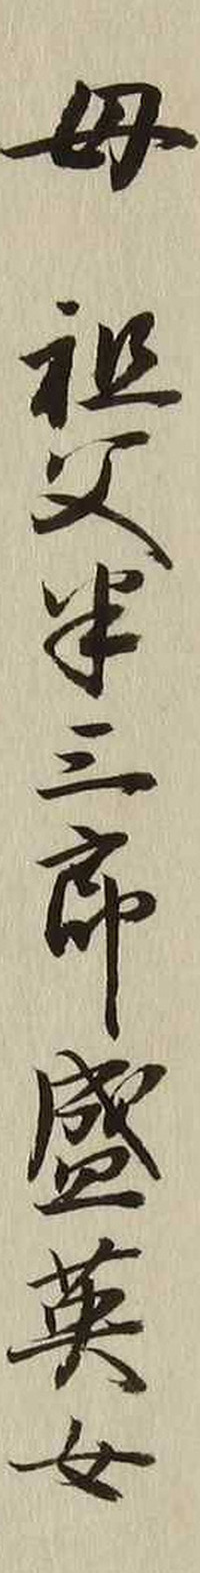母祖父半三郎盛英女
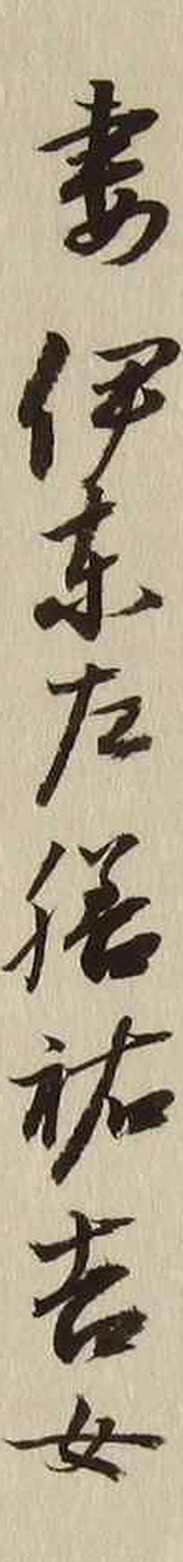妻伊東左膳祐吉女
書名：諸士系譜　巻之61　と之部4
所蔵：会津若松市立会津図書館
